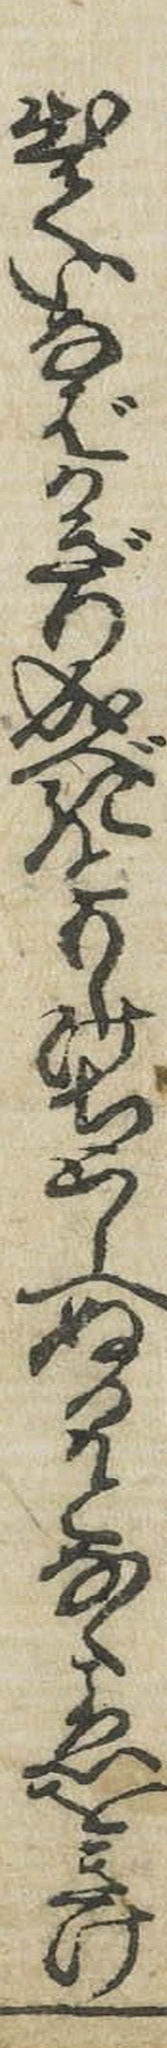出ていなばかぎり成べきともしけちとしへぬるかとなくこゑをきけ
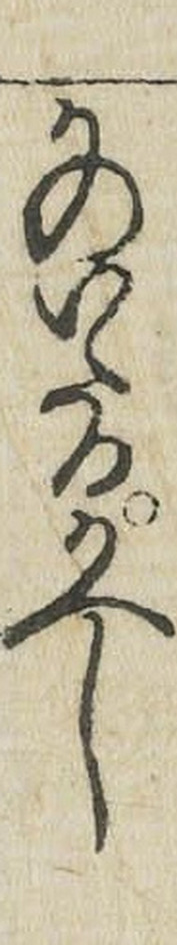かのいたる。かへし
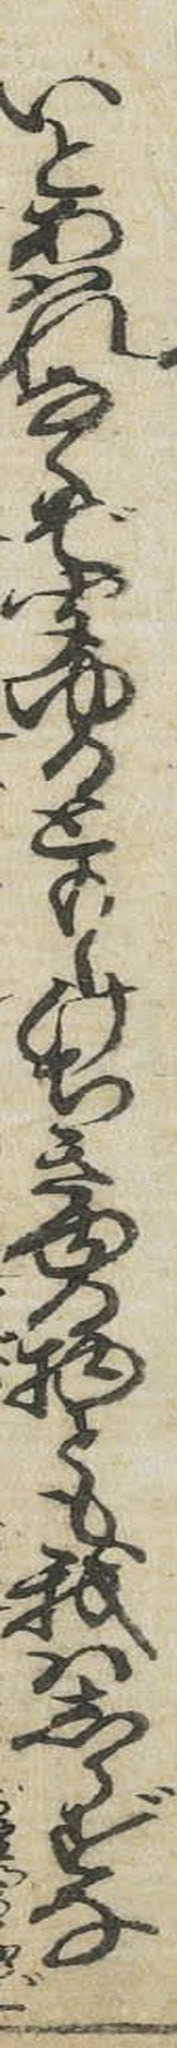いとあはれなくぞ聞ゆるともしけちきゆる物とも我はしらずな
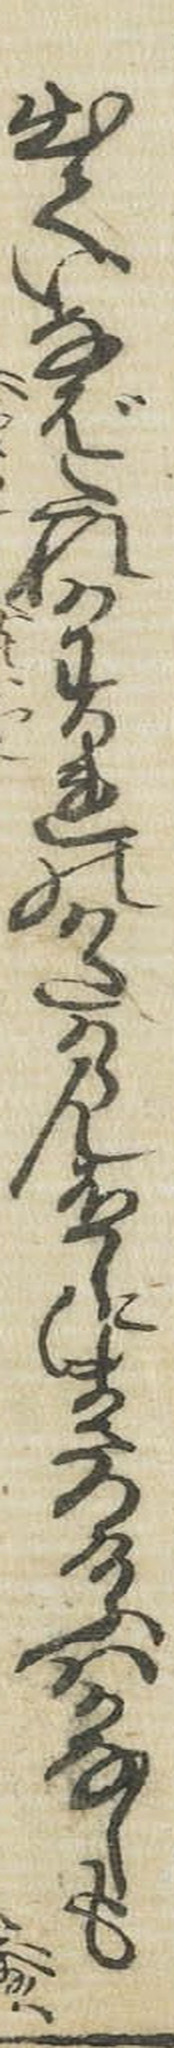出ていなばたれかわかれのかたからん有しにまさるけふはかなしも

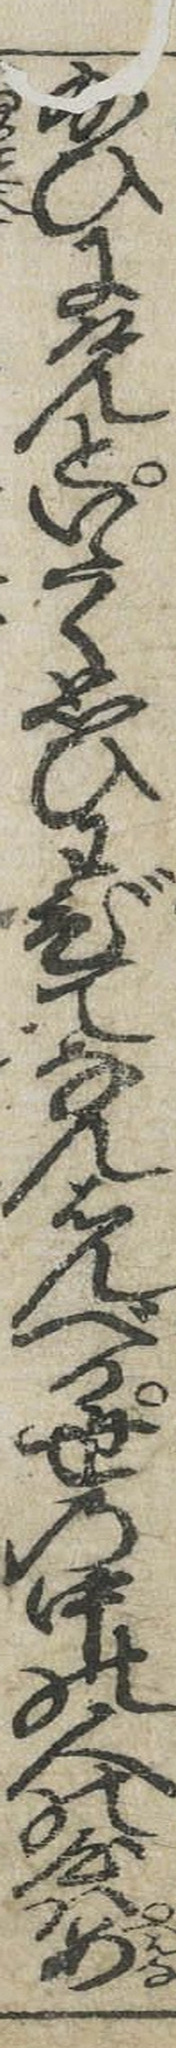給ひにけんと。いたく思ひわびてなんはんべる。世の中の人の心は。め
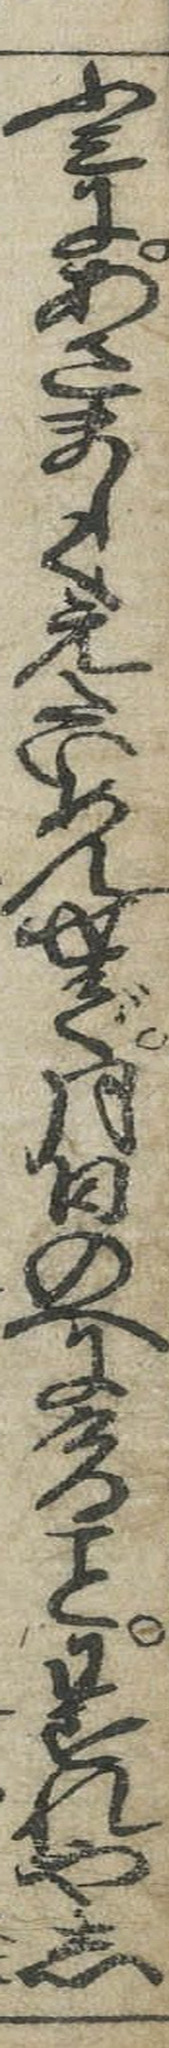ふみに。あさましくえたいめんせで。月日のへにけること。わすれやし
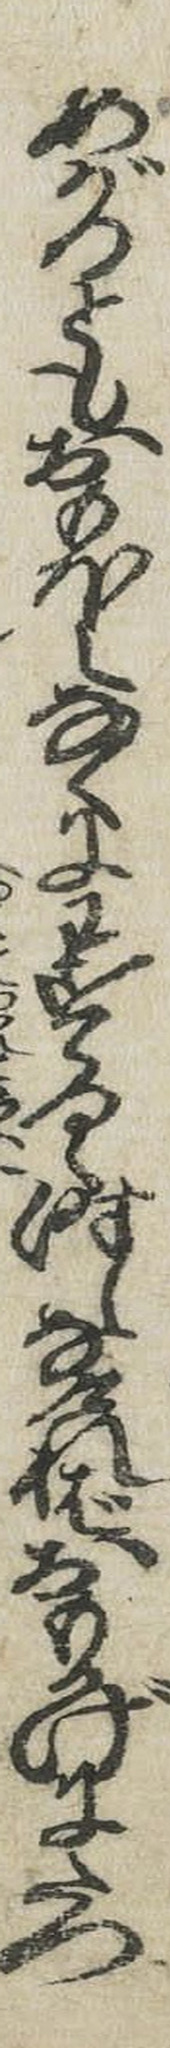めがるともおもほえなくにわするゝ時しなければおもかげにたつ
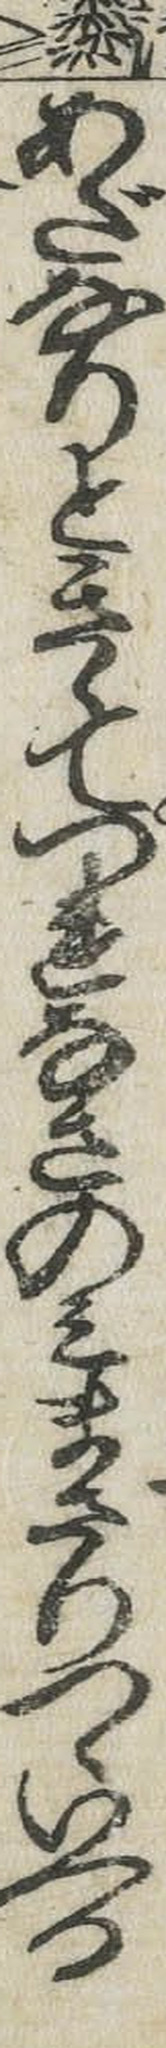あだなりときゝて。つれなきのみまさりつゝいへる
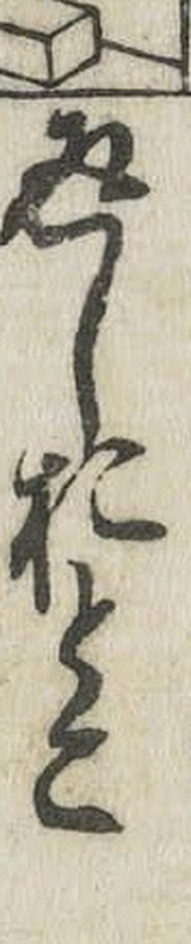返しおとこ
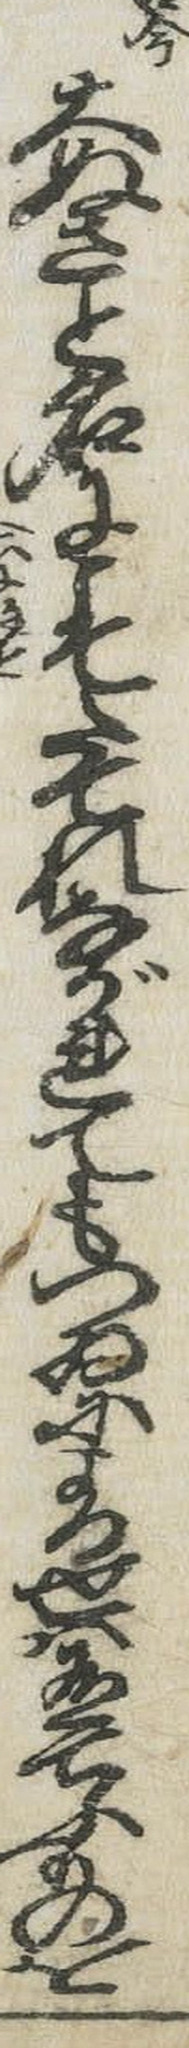古今大ぬさと名にこそたてれながれてもつゐによるせは有てふものを
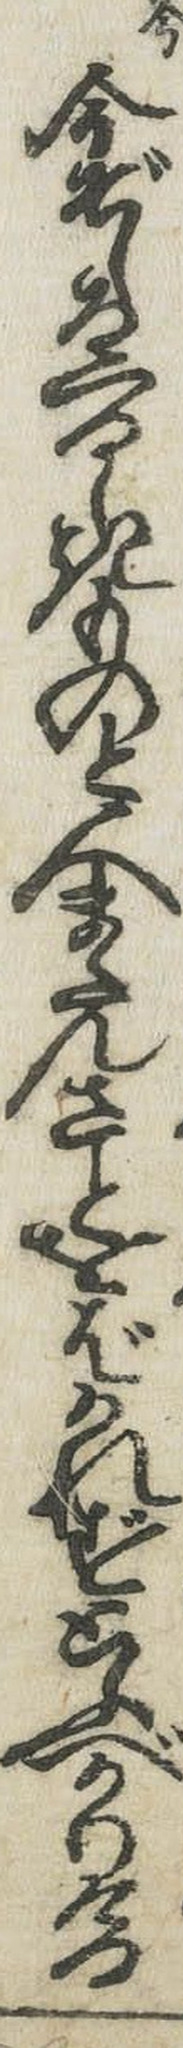古今今ぞしるくるしきものと人またんさとをばかれずとふべかりける
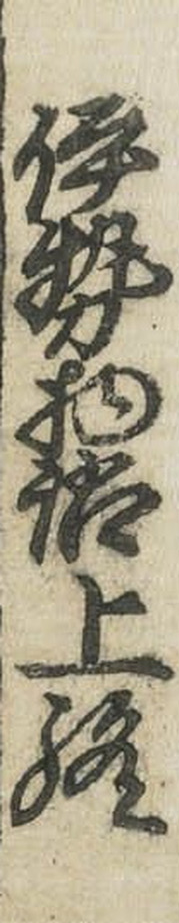伊勢物語上終
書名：新板絵入伊勢物語 : かうしやく付 2巻 上
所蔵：東京学芸大学教育コンテンツアーカイブ
